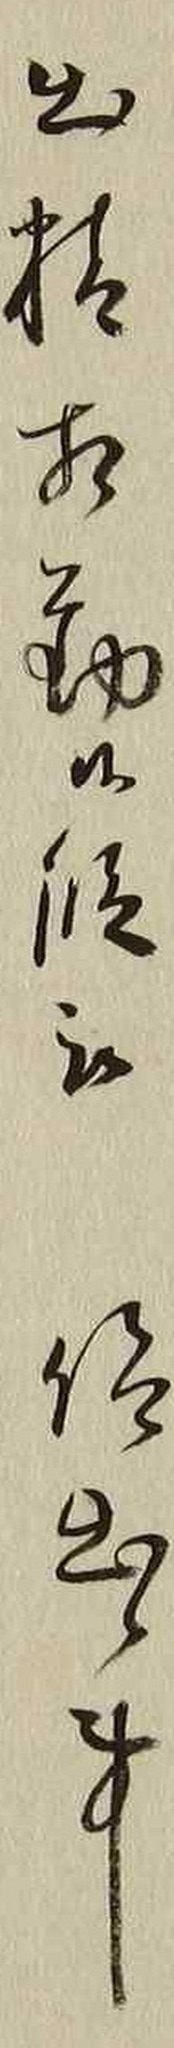出精相勤候段被仰出候事
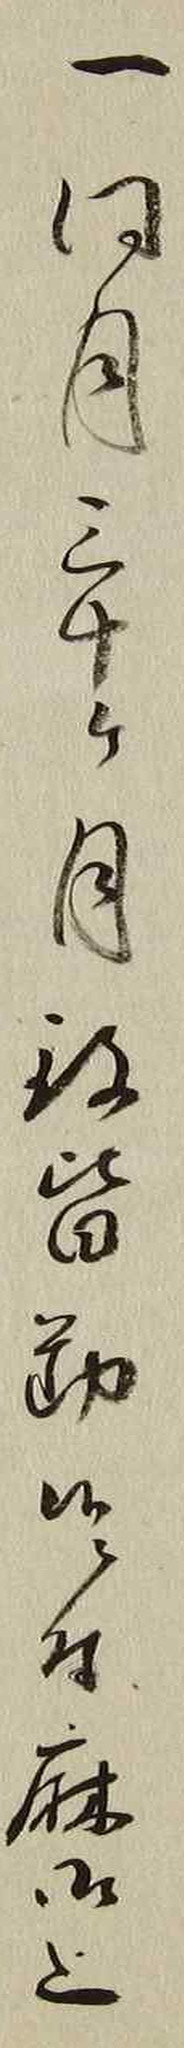一同月三十ケ月致皆勤候ニ付麻御上
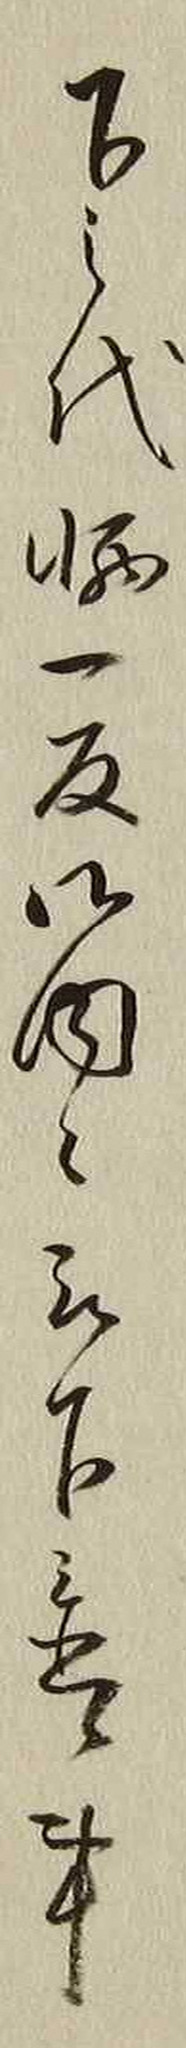下之代晒一反御内々被下置候事
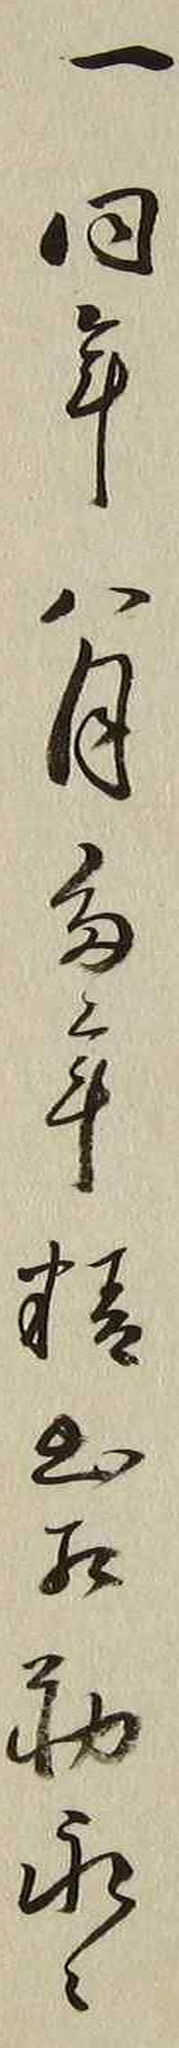一同年八月多年精出相勤永々
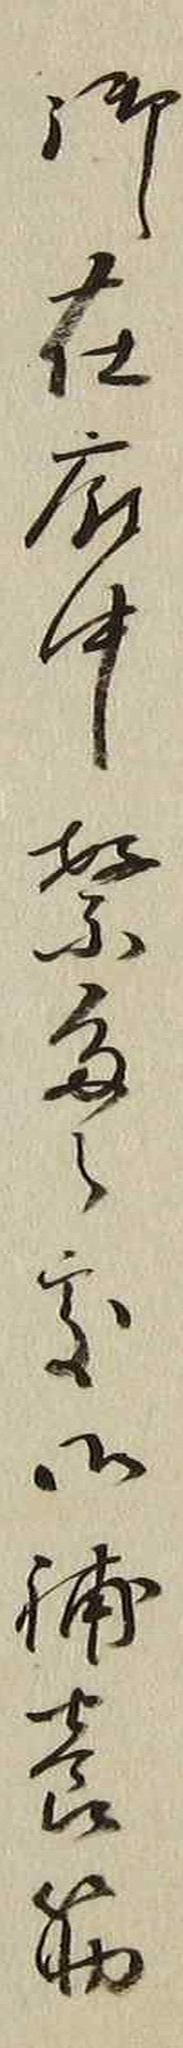御在府中繁多之処御補養筋
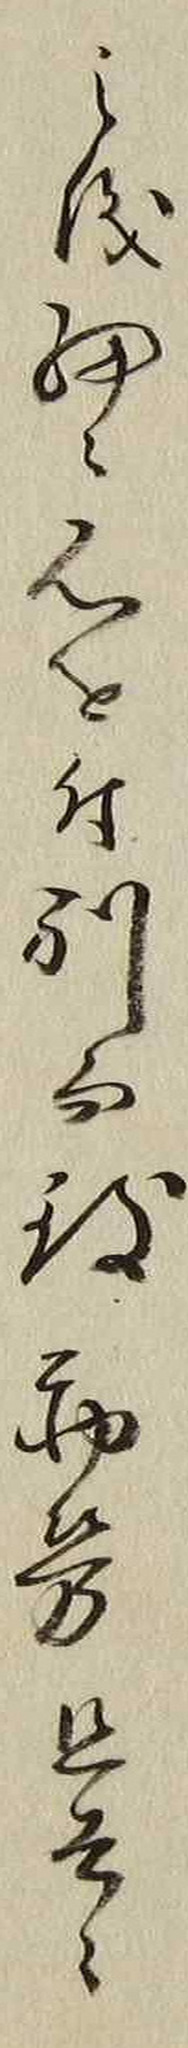之儀細々心を付別而致勤労且去々
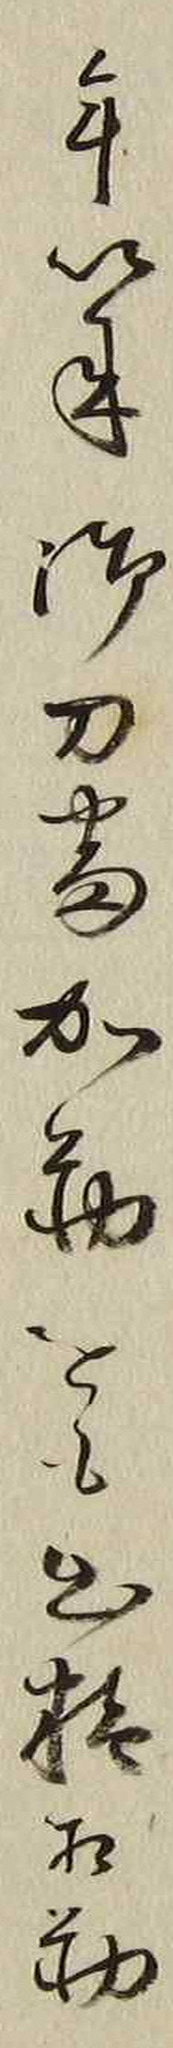年以来御刀番加勤をも出精相勤
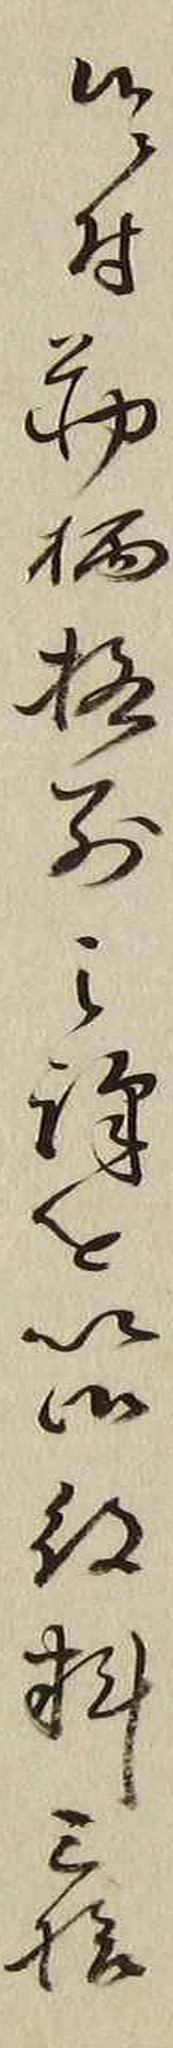候ニ付勤柄格別之訳を以御役料三拾
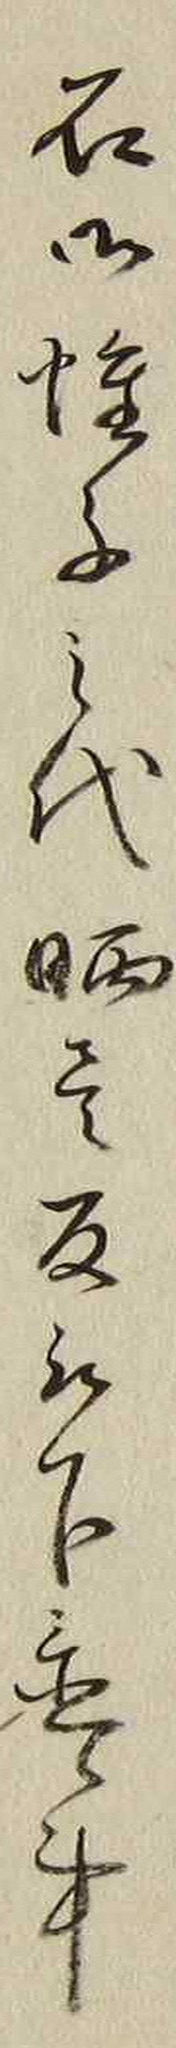石御帷子之代晒壱反被下置候事
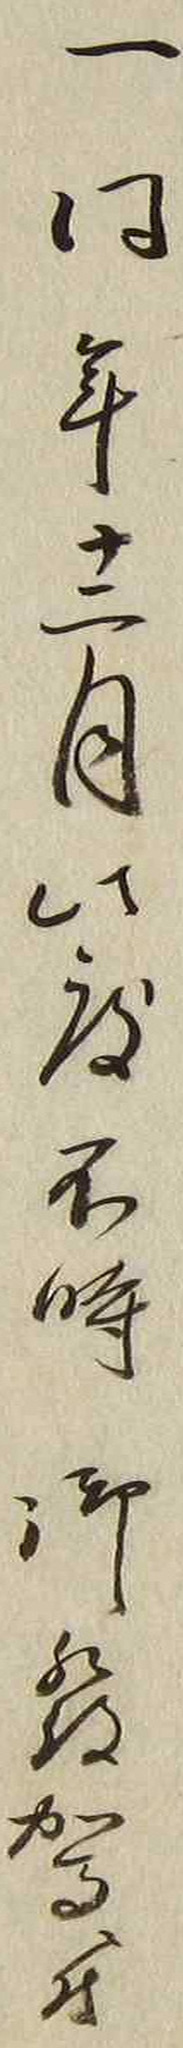一同年十二月此度不時御発駕ニ付
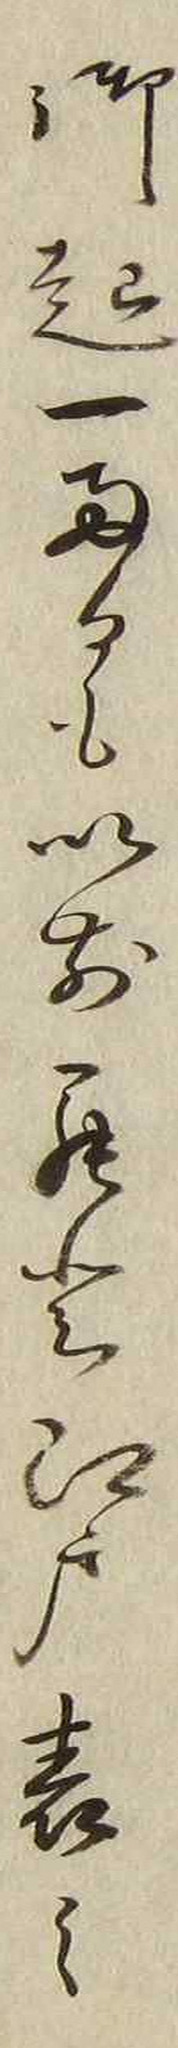御起一両日も以前罷登江戸表之

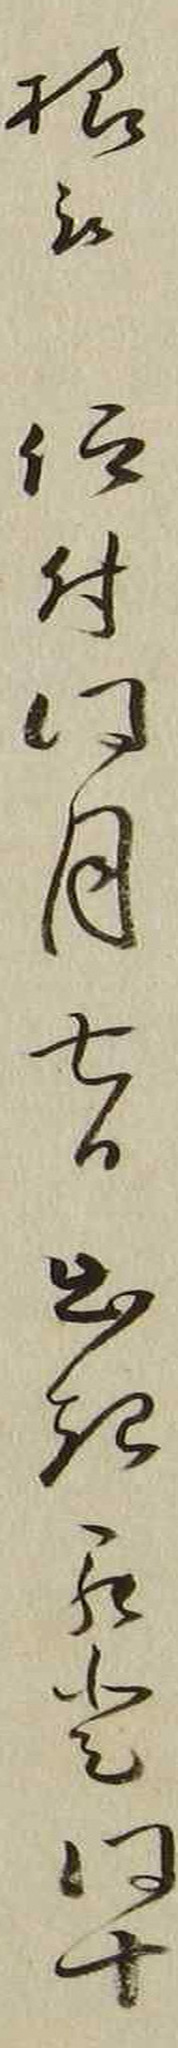様被仰付同月七日出起罷登同十
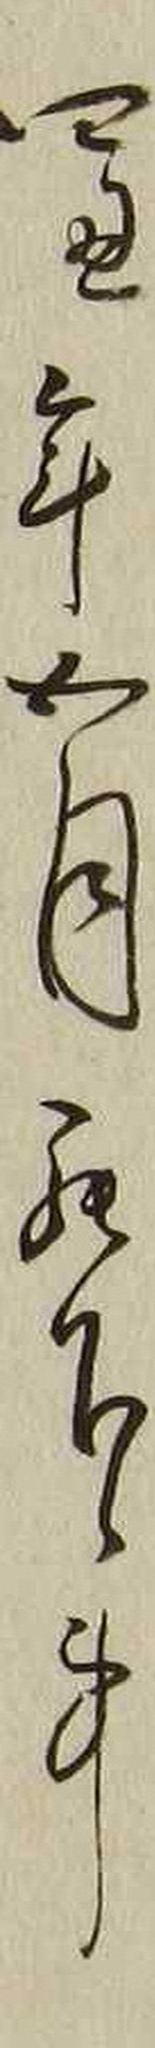四丑年五月罷下候事
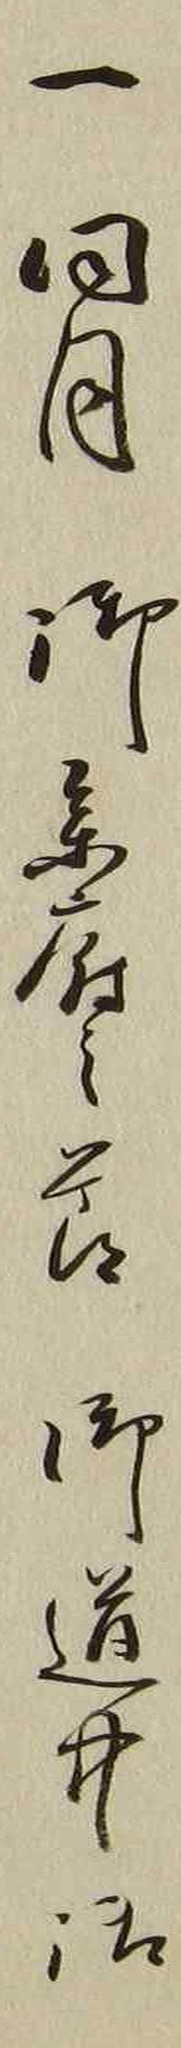一同月御参府々節御道中御
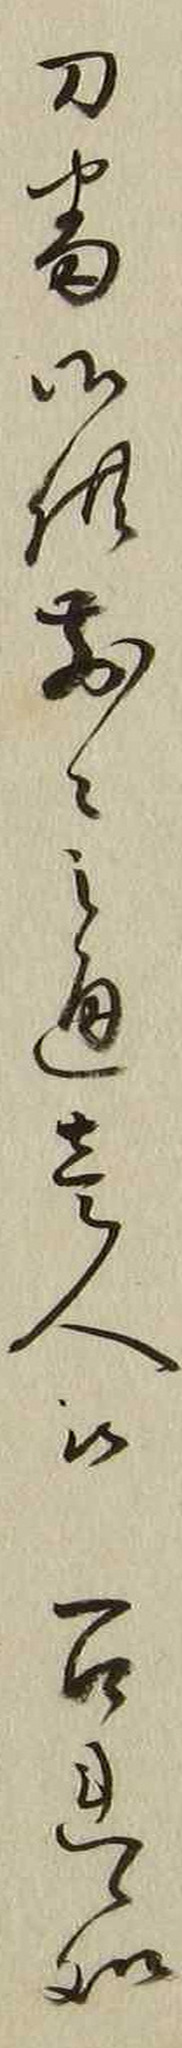刀番御供前々之通壱人被召連候処
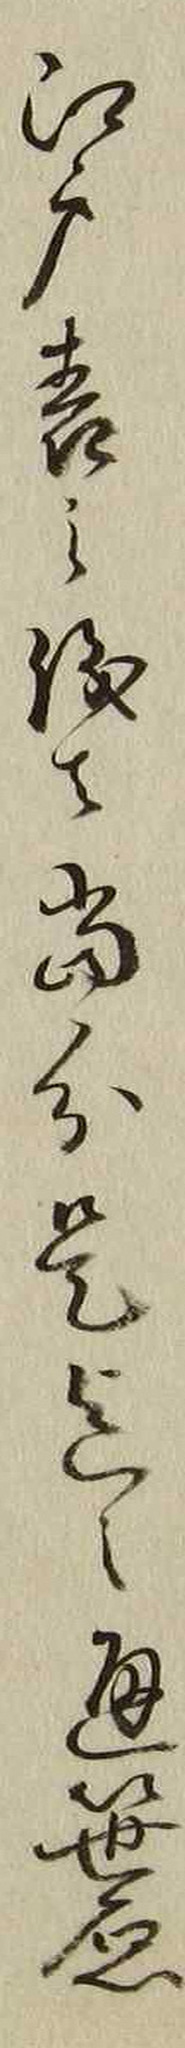江戸表之儀者当分是迄々通笹原
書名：諸士系譜　巻之25　い之部25
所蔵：会津若松市立会津図書館
